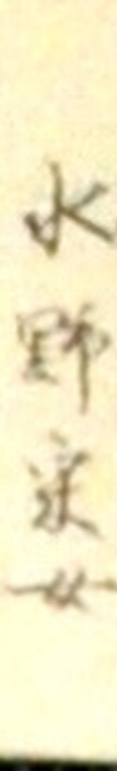水野采女

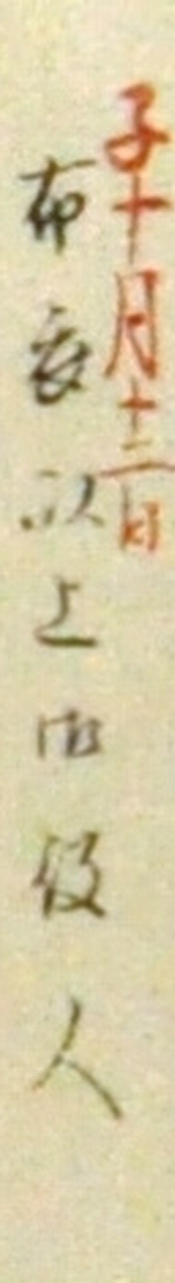布衣以上御役人
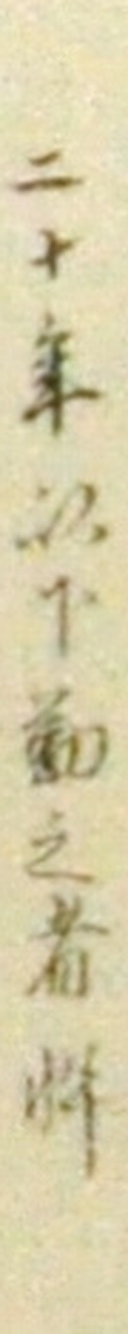二十年以下勤之者忰
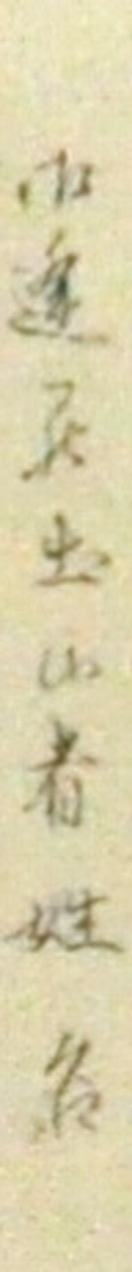御逢罷出候者姓名
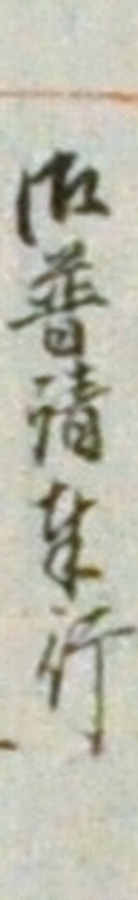御普請奉行
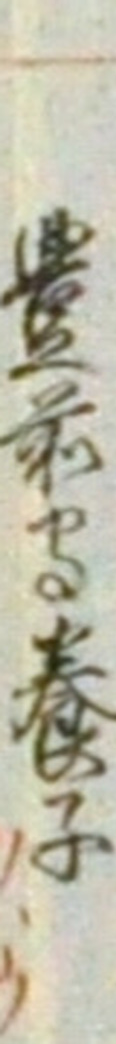豊前守養子
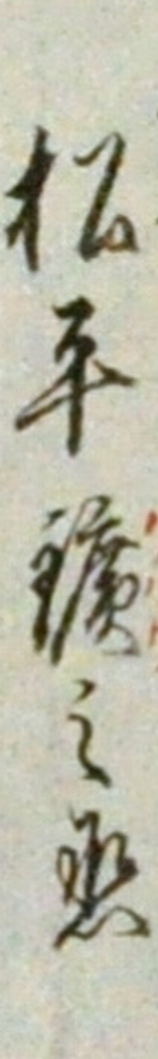松平鑛之丞
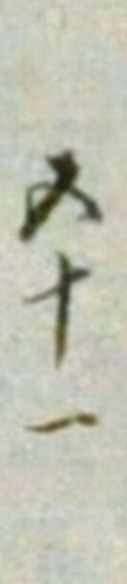五十一
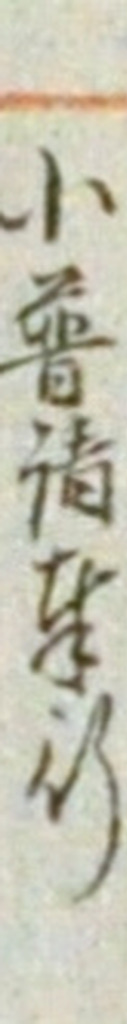小普請奉行
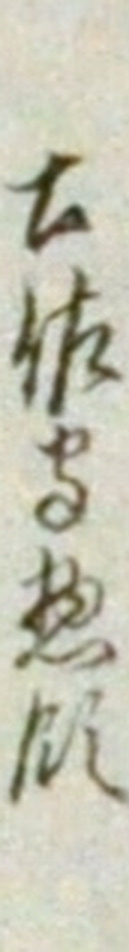土佐守惣領
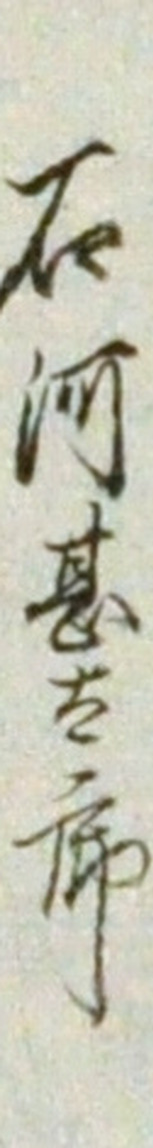石川甚太郎
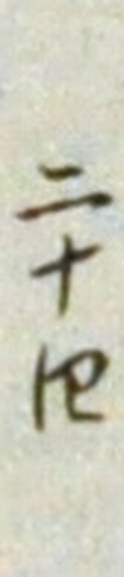二十四
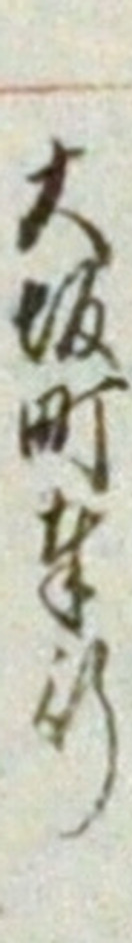大坂町奉行
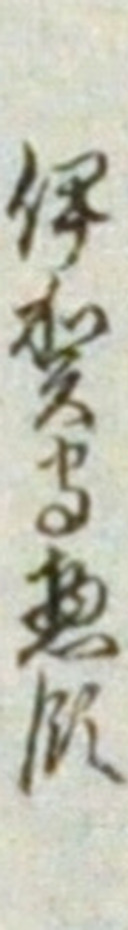伊賀守惣領
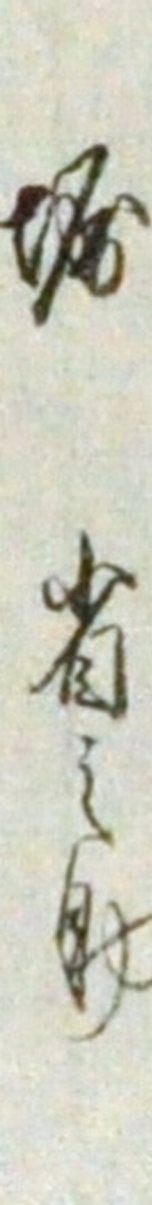堀省之助
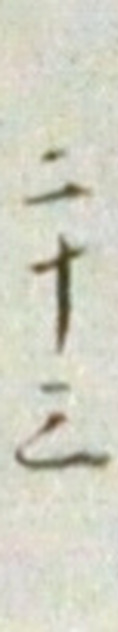二十三
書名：若年寄御役中之御書物〔一括〕
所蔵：伊那市立高遠町図書館・合同会社AMANE
